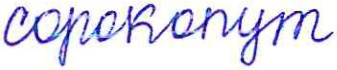сорокопут
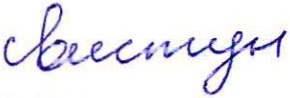свистун
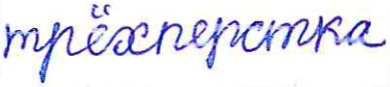трёхперстка
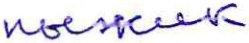пыжик
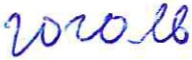гоголь
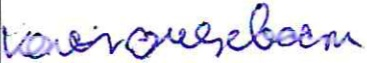колючехвост
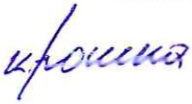крошка
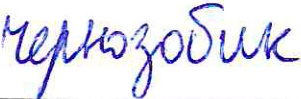чернозобик
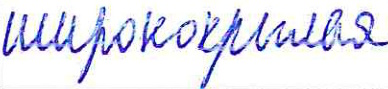ширококрылая
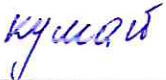кумай
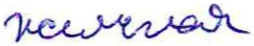желчная
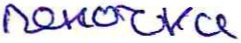пеночка
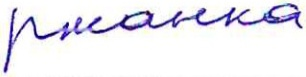ржанка
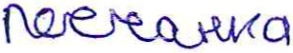песчанка
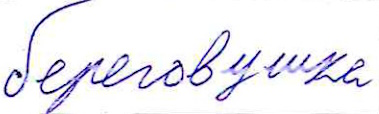береговушка
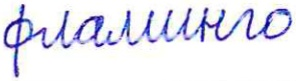фламинго
